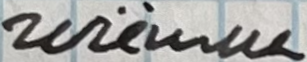чечётка
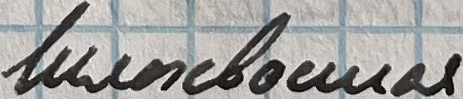вилохвостая
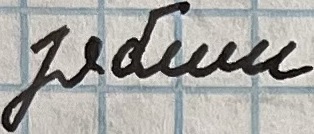зяблик
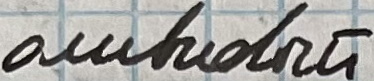оливковый
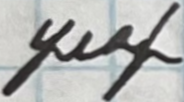улар
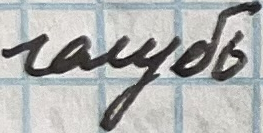голубь
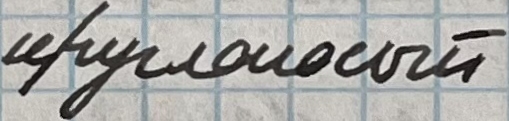круглоносый
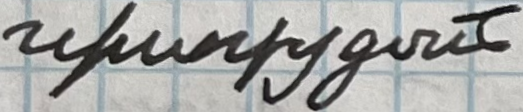черногрудый
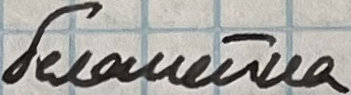белошейка
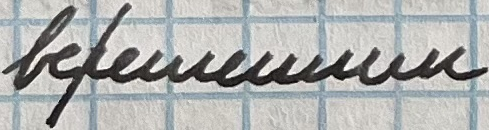веретенник
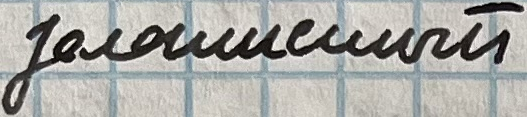золотистый
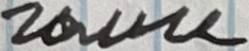чомга
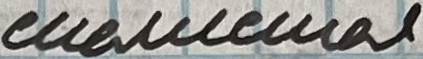скалистая
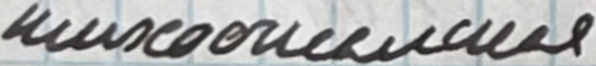тихоокеанская
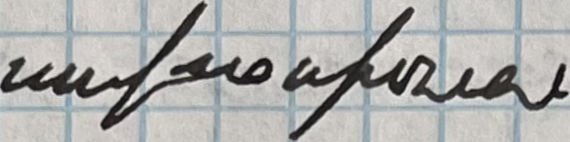ширококрылая
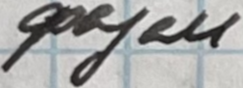фазан
